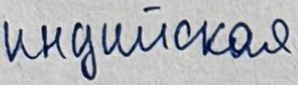индийская
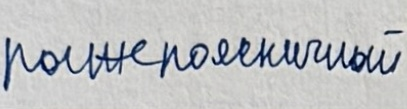рыжепоясничный
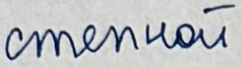степной
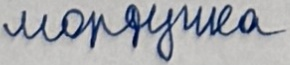мордунка
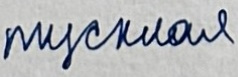тусклая
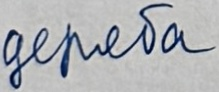деряба
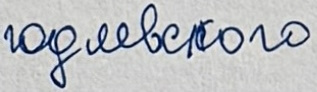годлевского
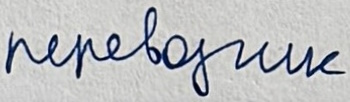перевозчик
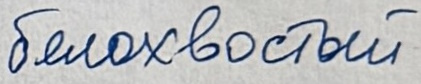белохвостый
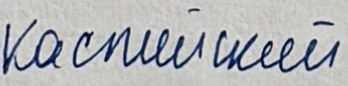каспийский
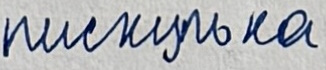пискулька
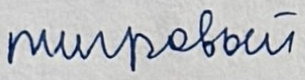тигровый
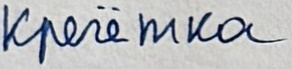кречётка
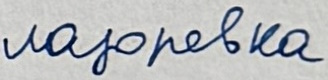лазоревка
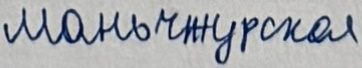маньчжурская
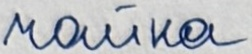чайка
